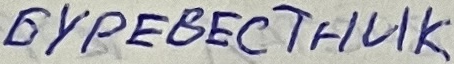буревестник
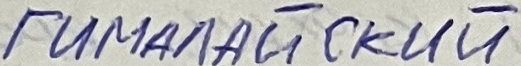гималайский
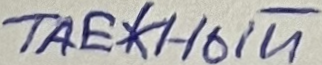таежный
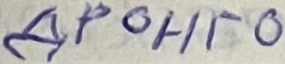дронго
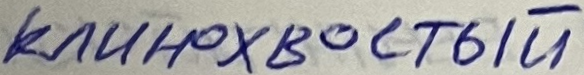клинохвостый
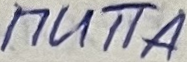питта
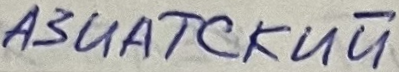азиатский
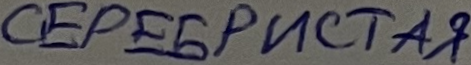серебристая
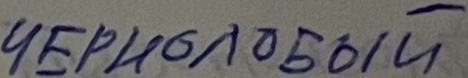чернолобый
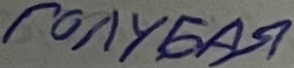голубая
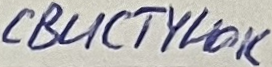свистунок
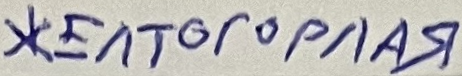желтогорлая
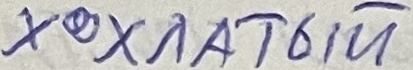хохлатый
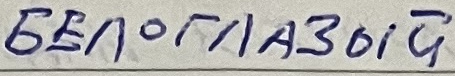белоглазый
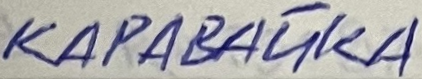каравайка
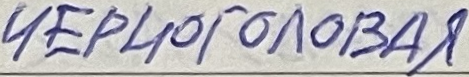черноголовая
